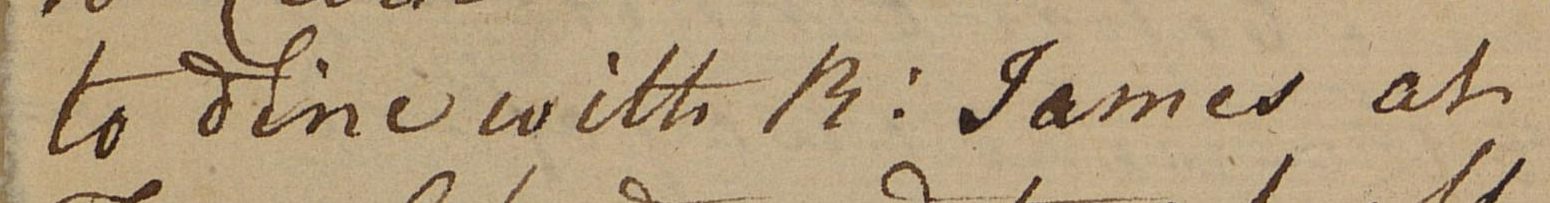to dine with R: James at
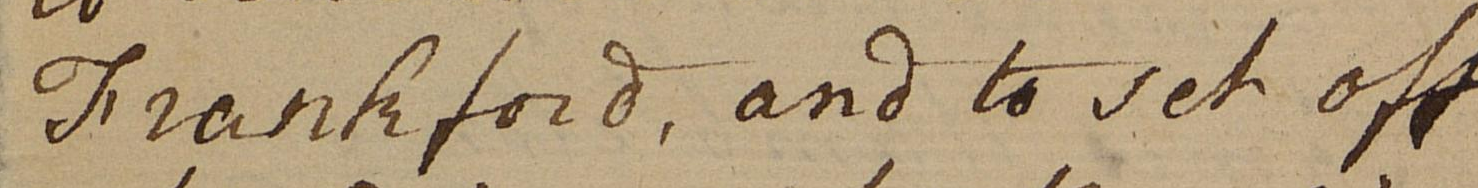Frankford, and to set of
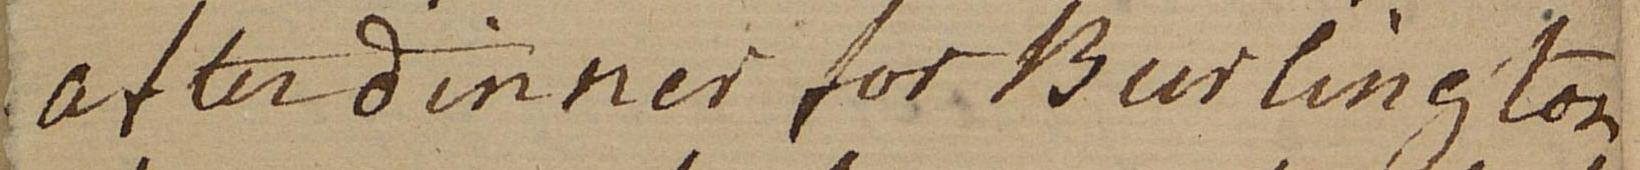after dinner for Burlington
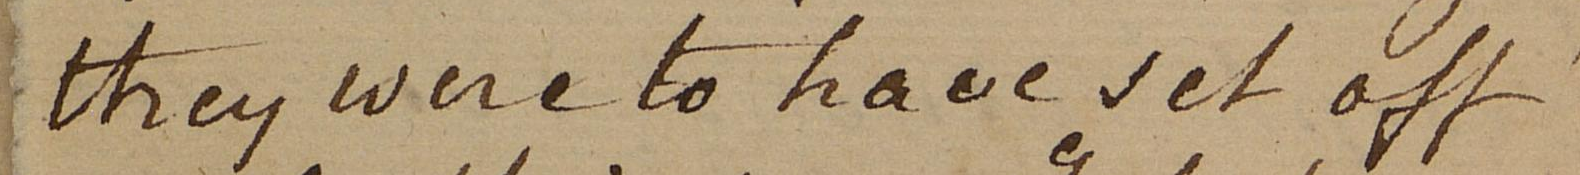they were to have set off
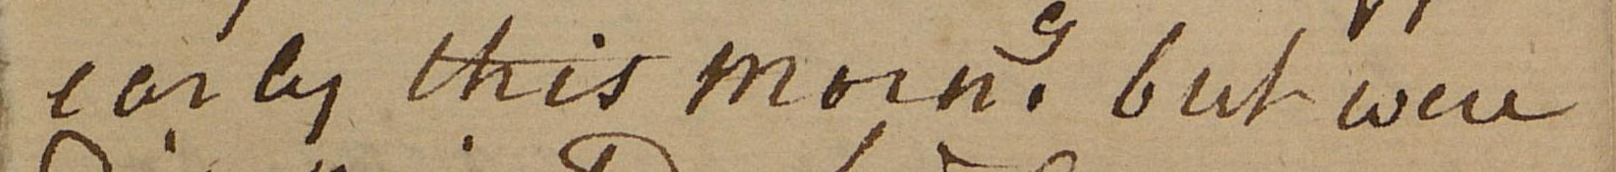early this morn^g. but were
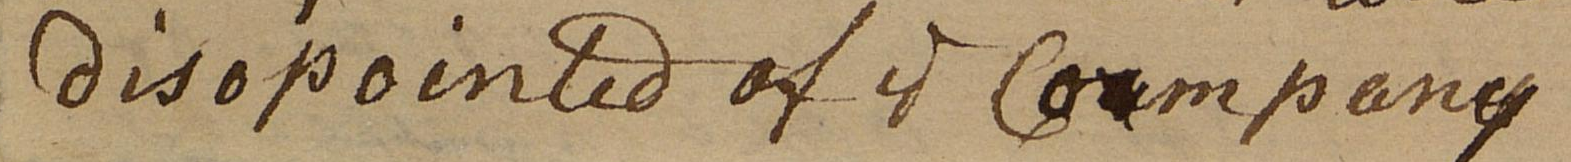disopointed of y^e Company
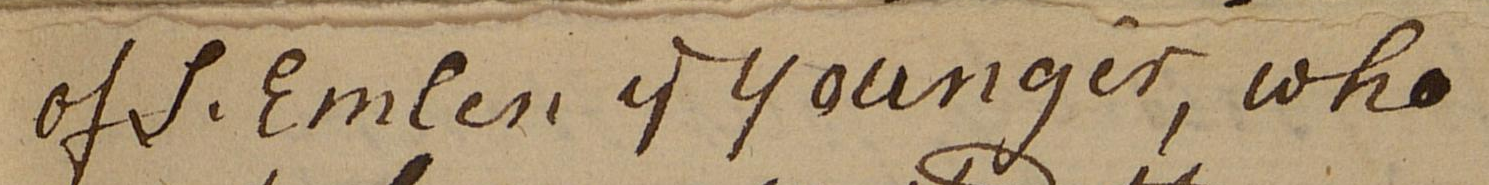of S. Emlen, y^e younger, who
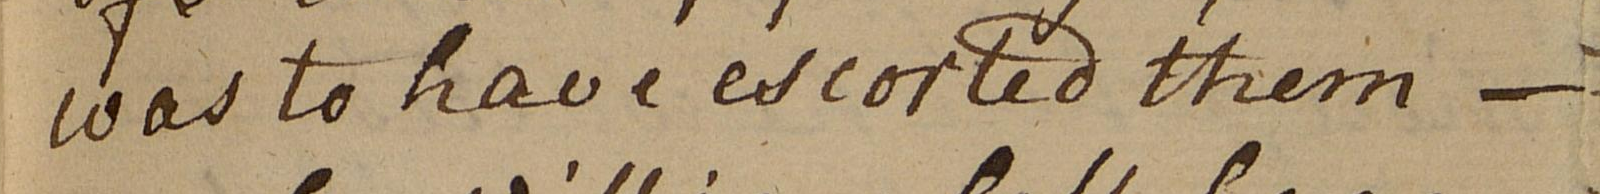was to have escorted them-
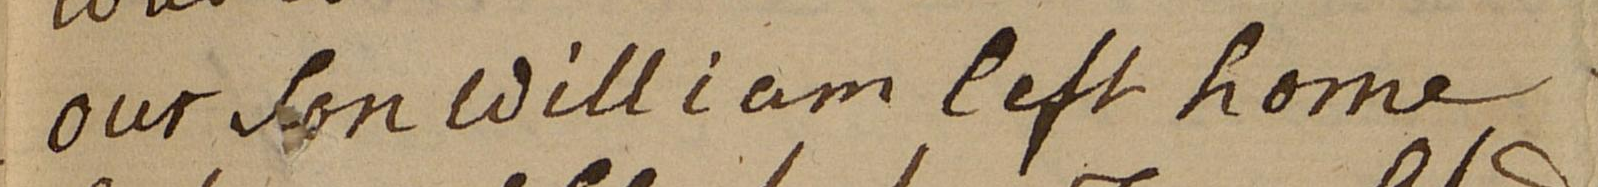our Son William left home
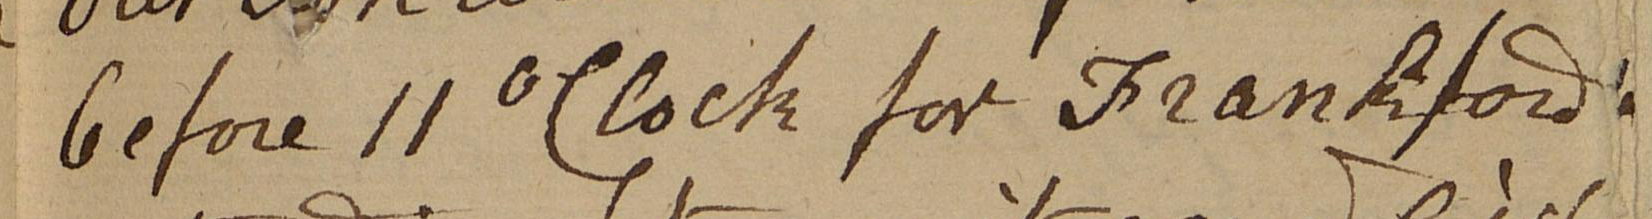before 11 ^o Clock for Frankford
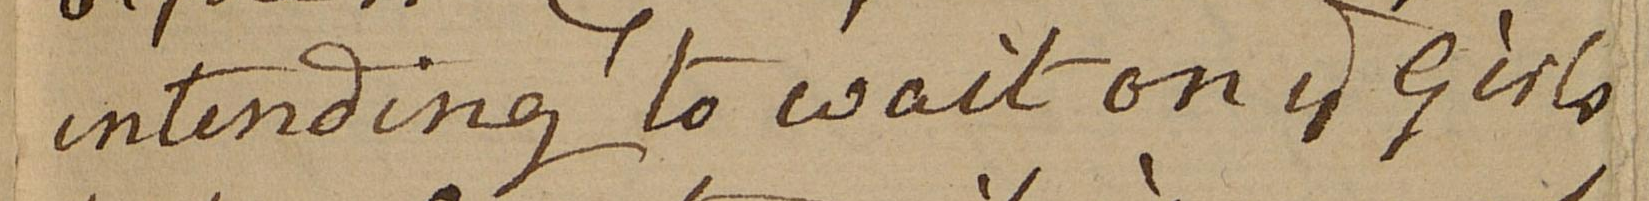intending to wait on y^e Girls
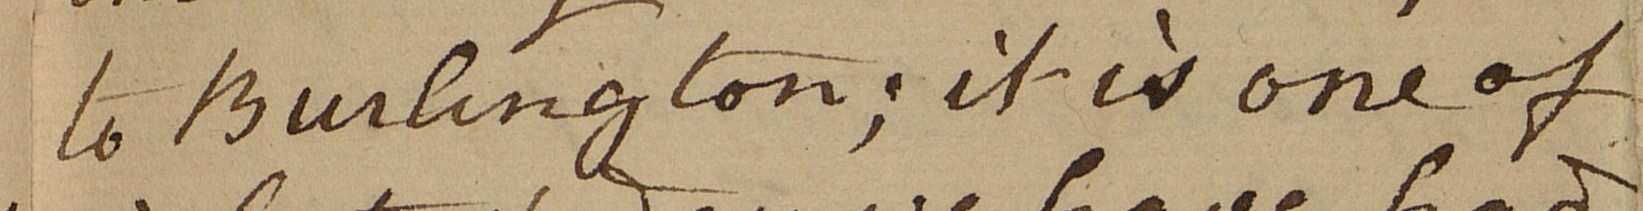to Burlington; it is one of
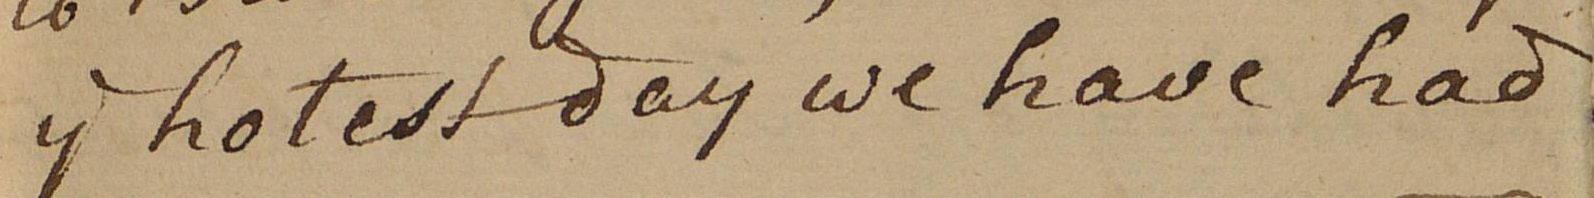y^e hotest day we have had
